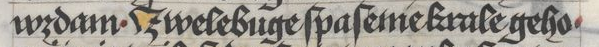wzdam.Zwelebuge ſpaſeníe krale geho.
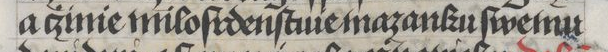a cżinie miloſrdenſtvie mazanku ſwemu
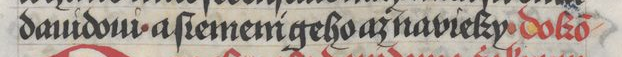davidovi.a ſiemeni geho až navieky.dokō
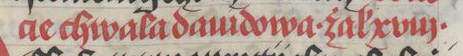cie chwala davidowa.żal xviij.
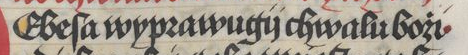Ebeſa wyprawugij chwalu bożí.
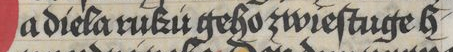a diela rukú geho zwieſtuge h¬
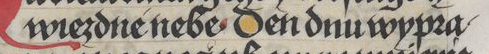wiezdné nebe.Den dnu wypra¬
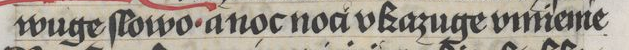wuge ſlowo.a noc noci ukazuge umienie
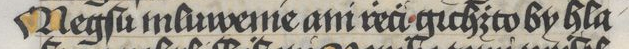Negſu mluweníe ani ṙeċi.gichżto by hla¬
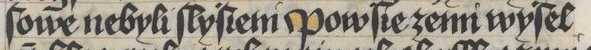ſowe nebyli ſlyẛieni Powẛie zemi wyẛel
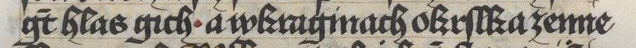ḡt hlas gich.a wkraginach okrſlka zemie
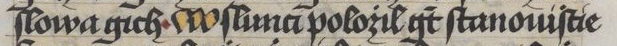ſlowa gich.Wſlunci položil ḡt ſtanoviẛtie
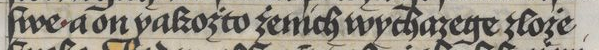ſwe.a on yakożto żeních wychazege zloże
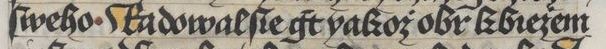ſweho.Radowalſie ḡt yakoż obr k bieżení
